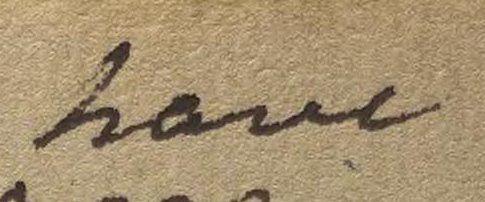have
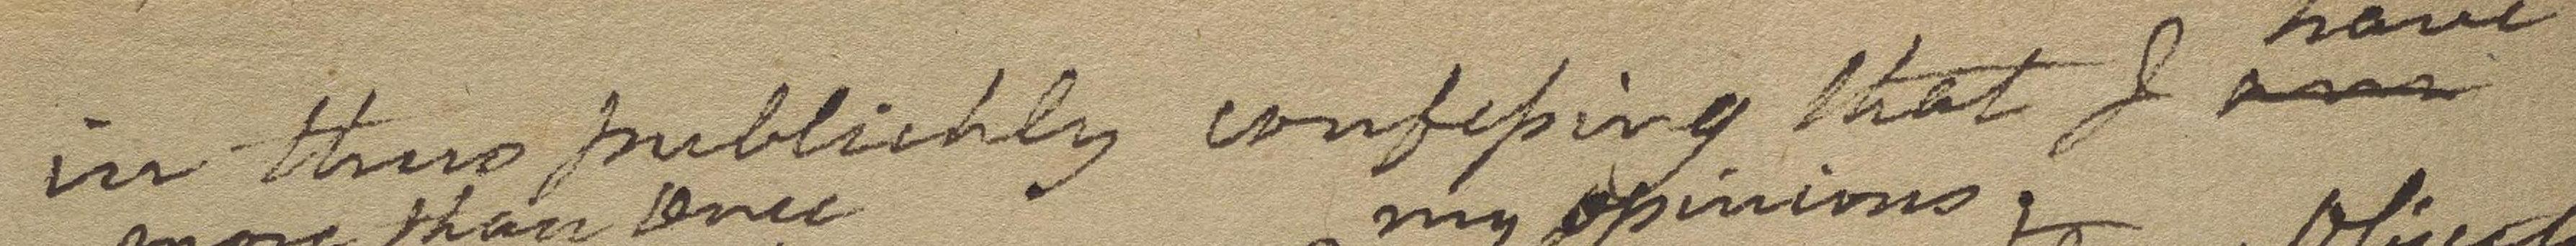in this publickly confessing that I [am]
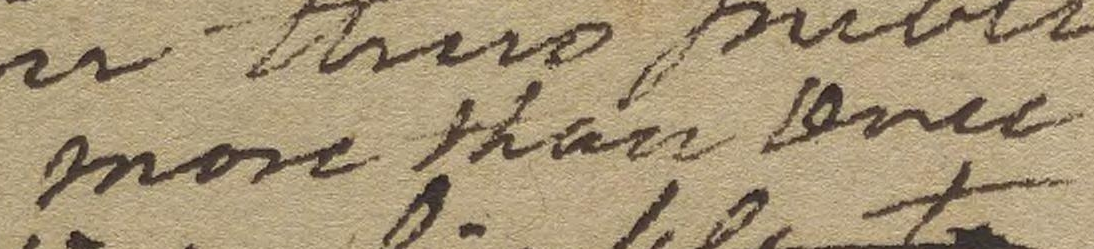more than once
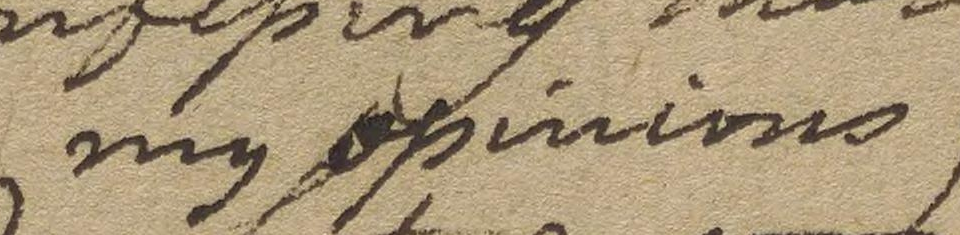my opinions
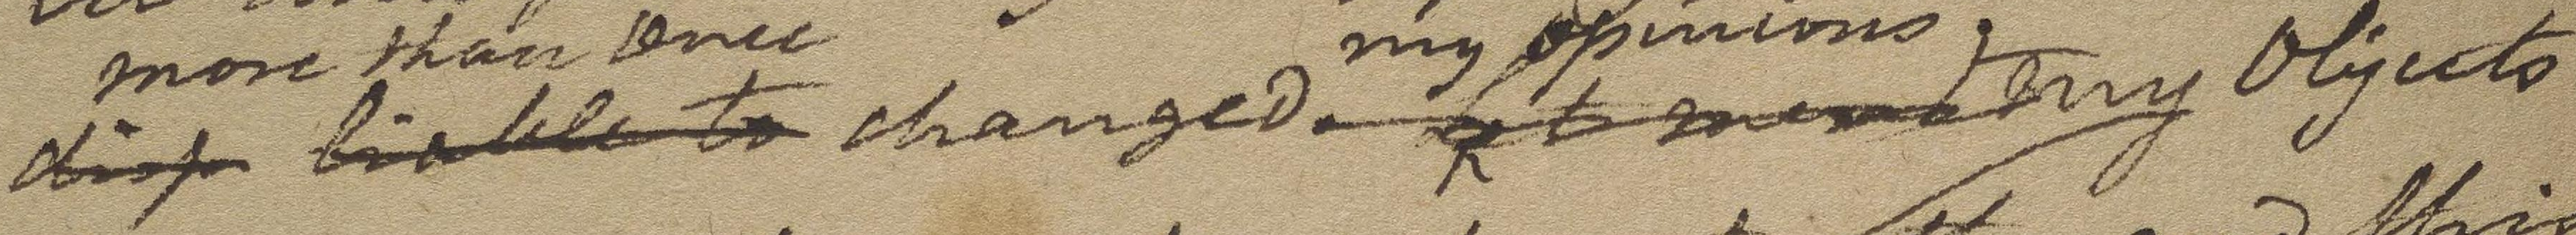[disp] [liable to] changed ^ [at men] (my objects
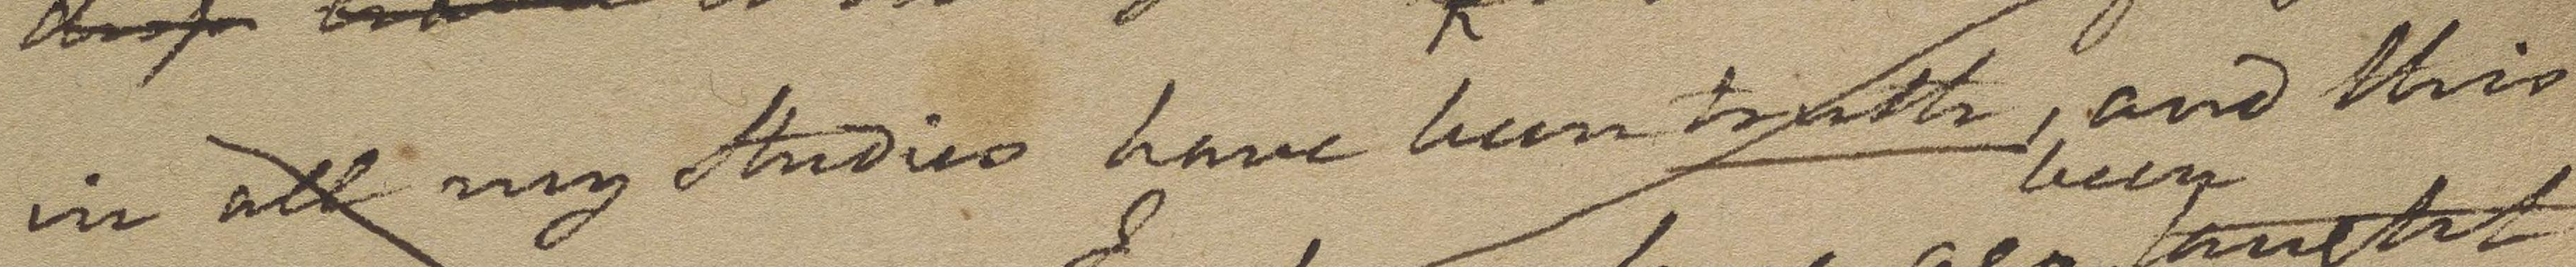in all my studies have been truth, and this
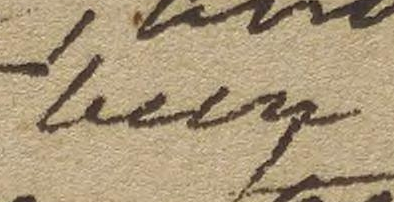been
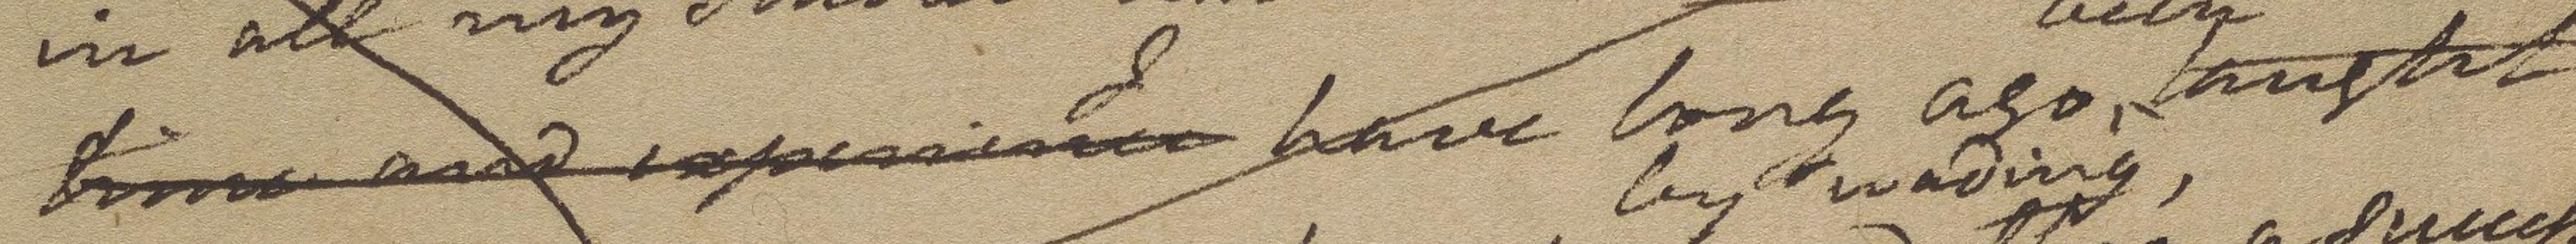[time and expression] ^I have long ago ^ taught
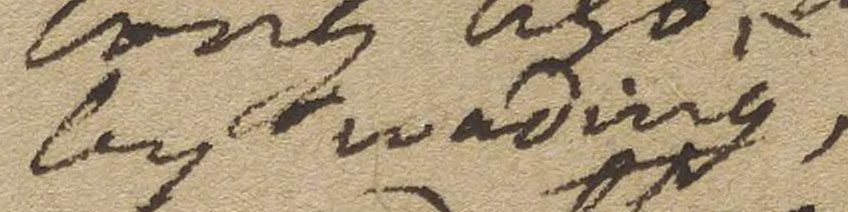by wading
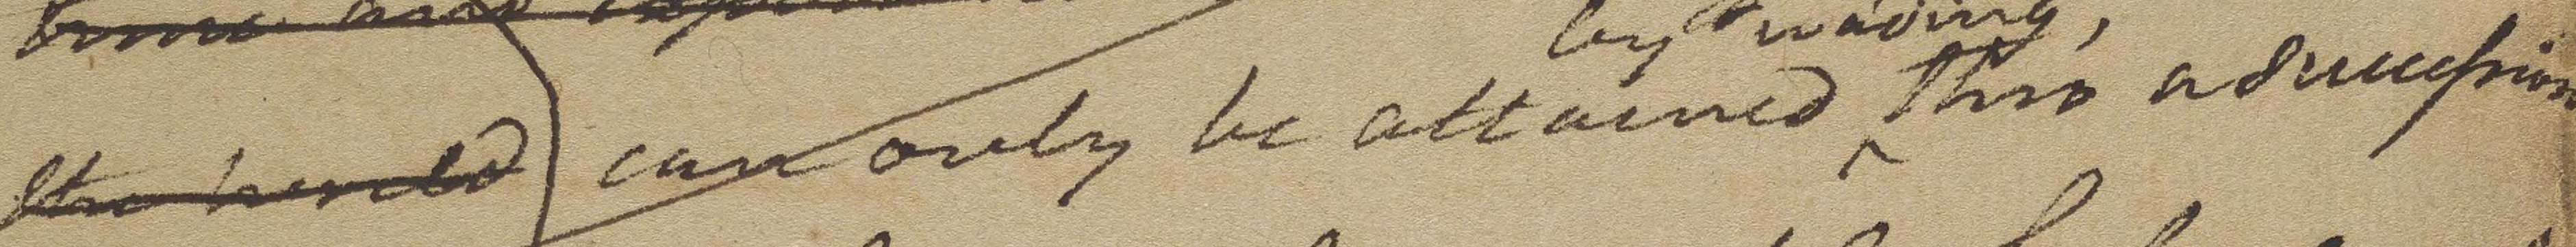[the world] can only be attained ^ thro' a succession
